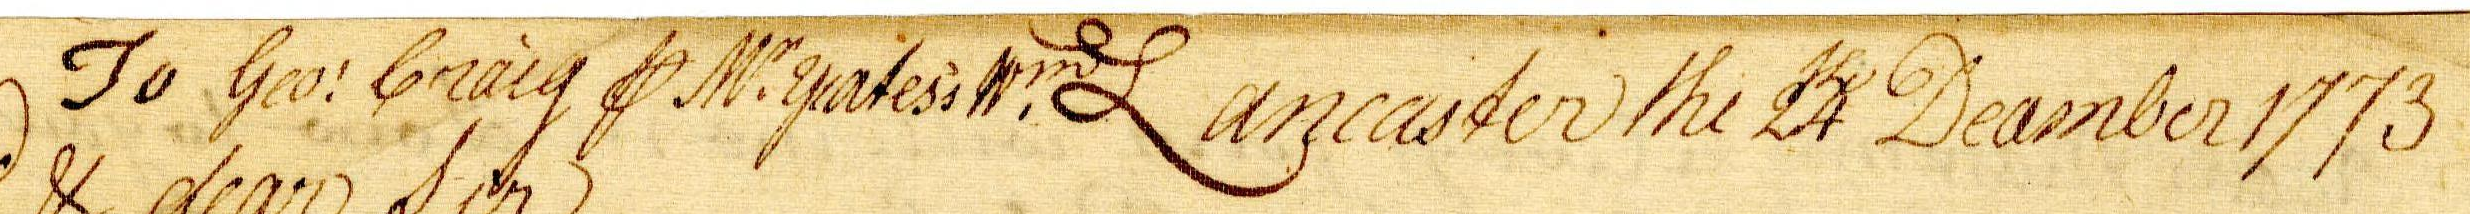To Geo: Craig per M^r. Yeates's W^m. Lancaster the 24^th December 1773
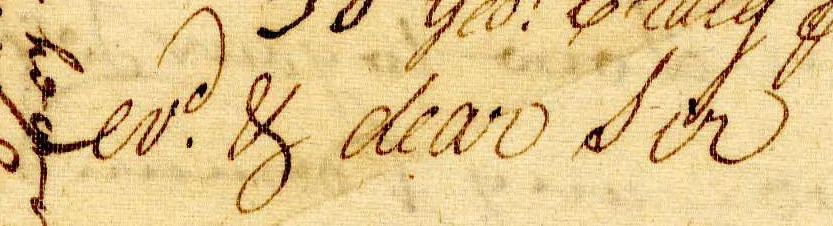es^d. & dear Sir
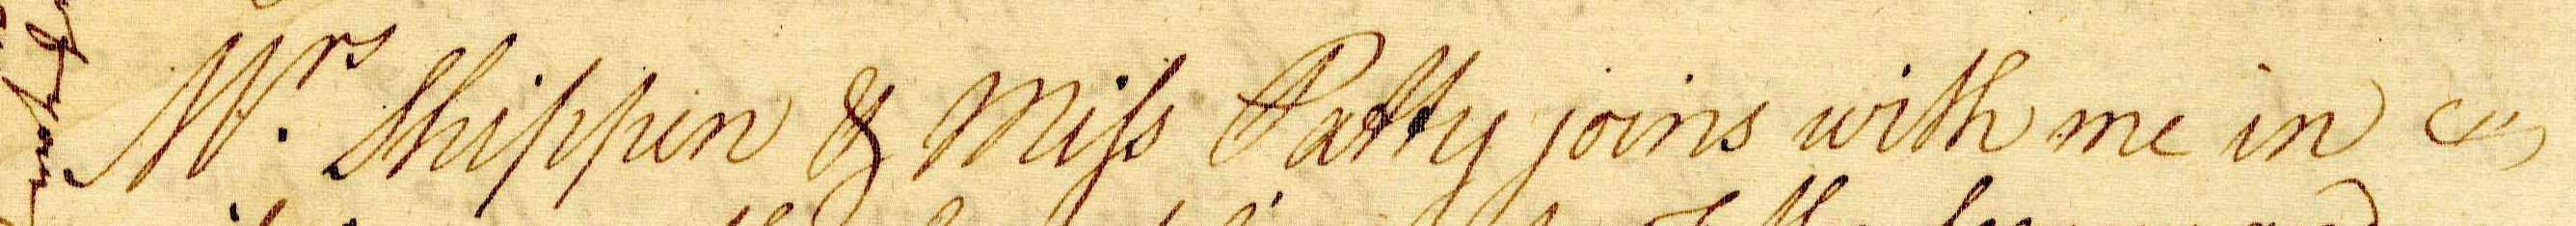M^rs. Shippen & Miss Patty joins with me in
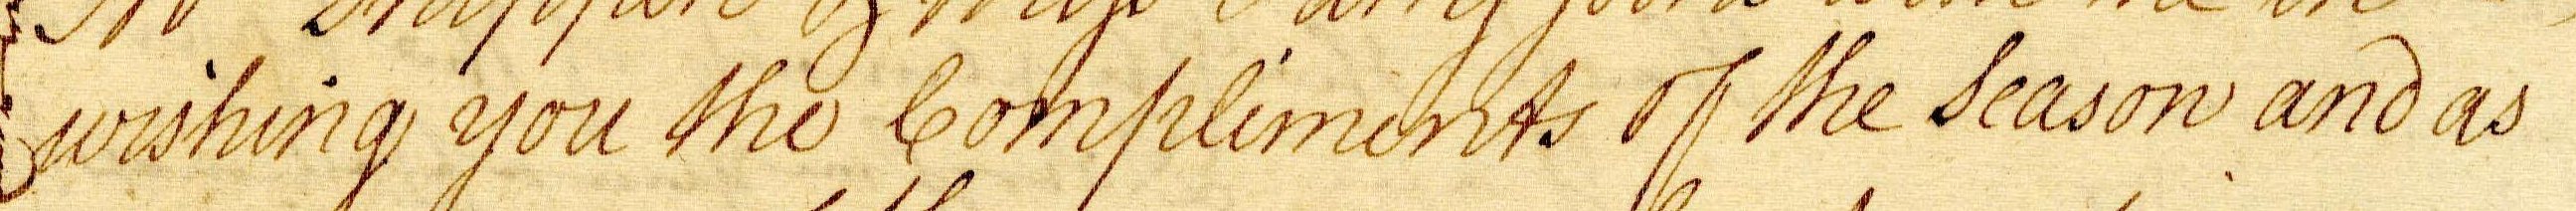wishing you the Compliments of the Season and as
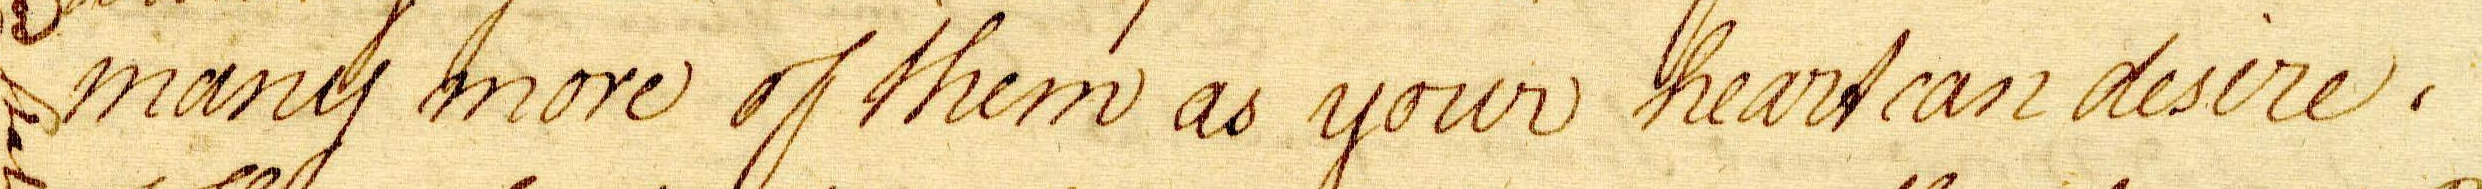many more of them as your heart can desire.
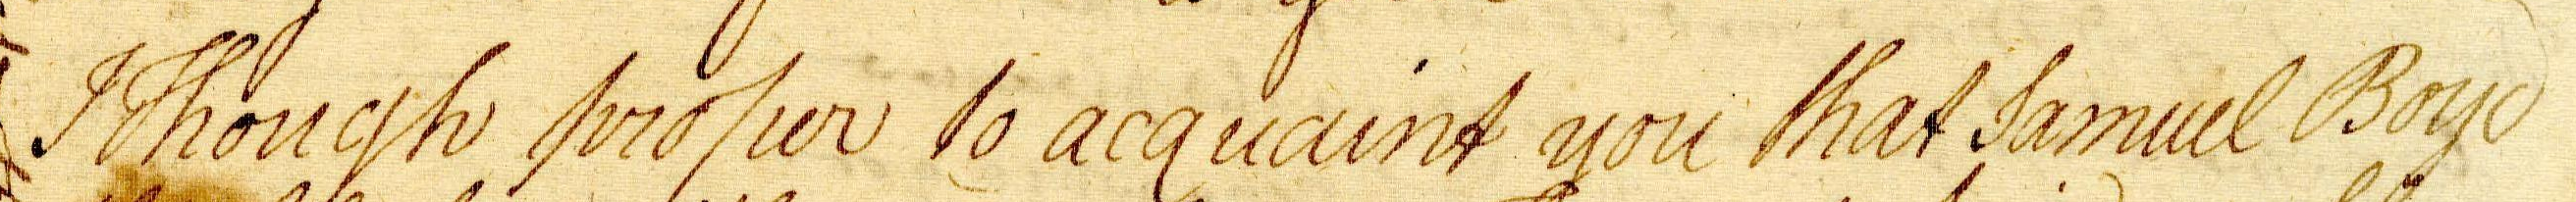I Though proper to acquaint you that Samuel Boyd
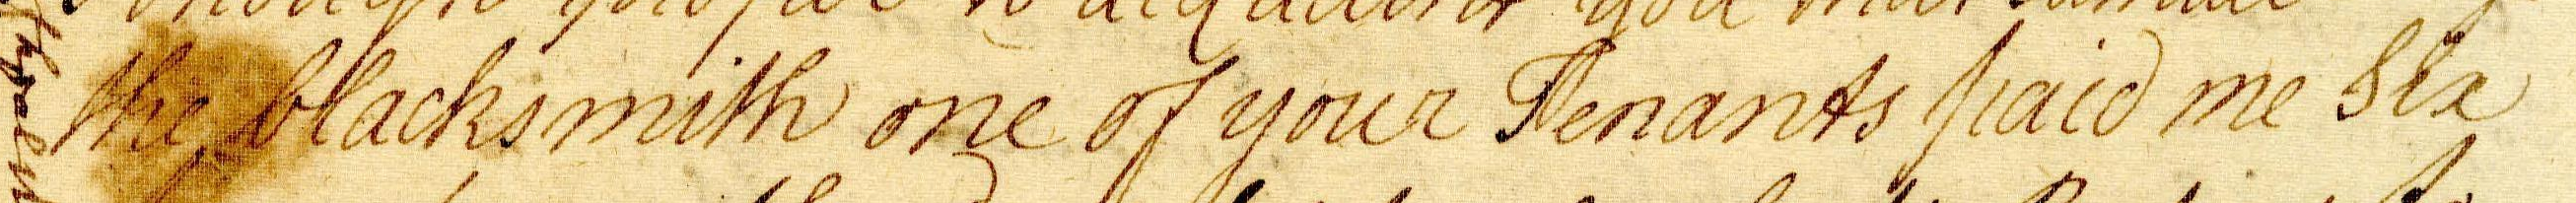the blacksmith one of your Tenants paid me six
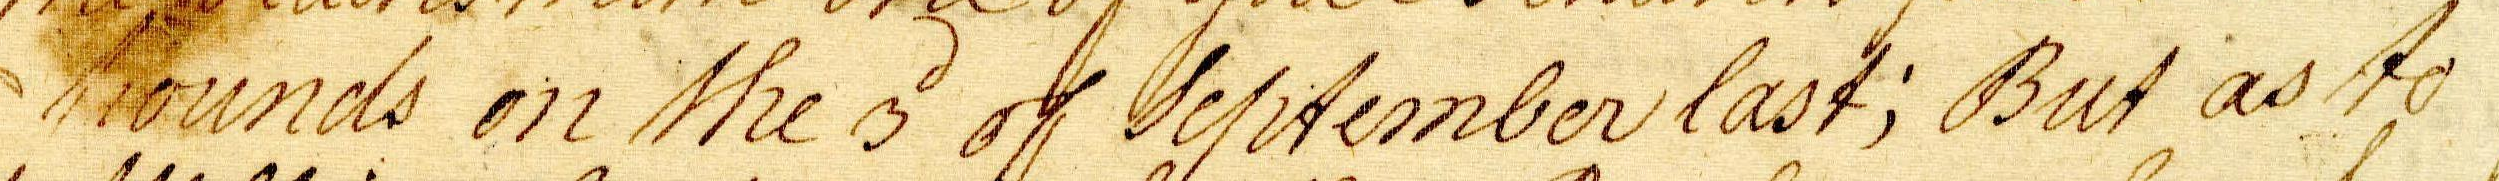pounds on the 3^d of September last; But as to
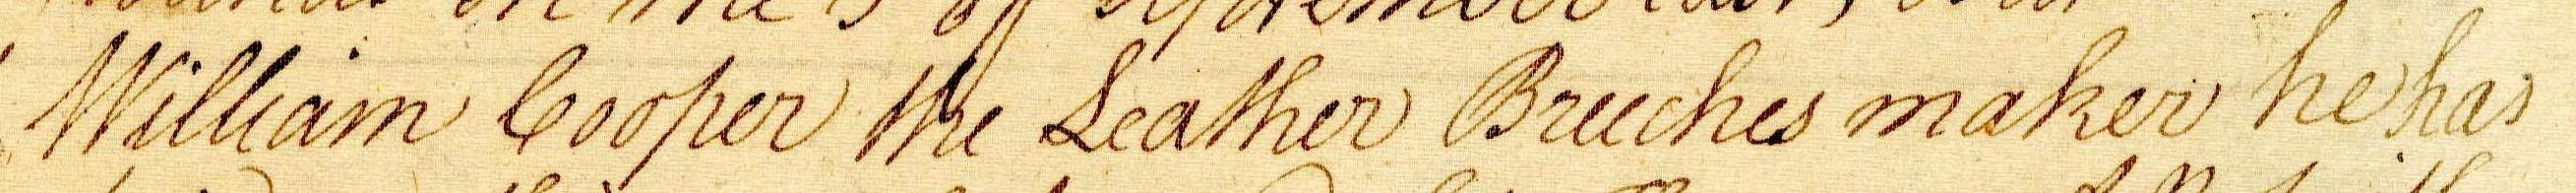William Cooper the Leather Bruches maker he has
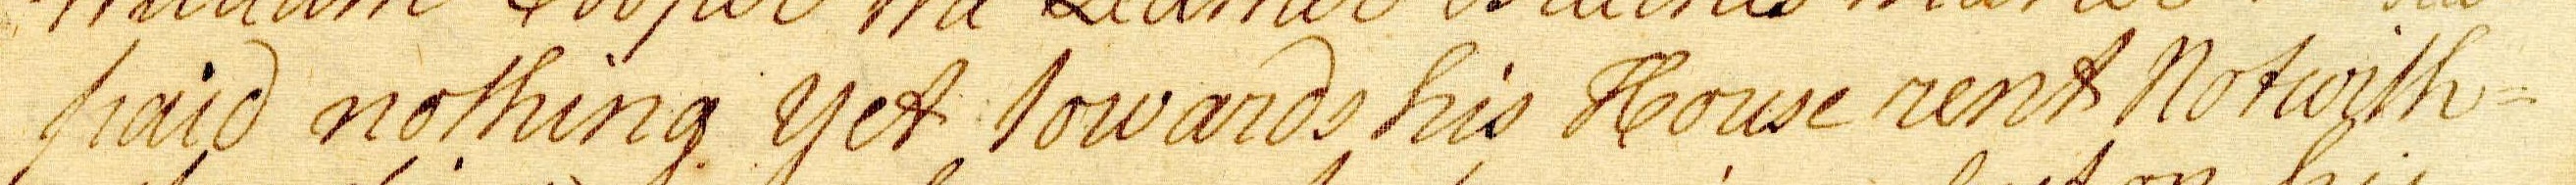paid nothing yet towards his House rent Notwith-
